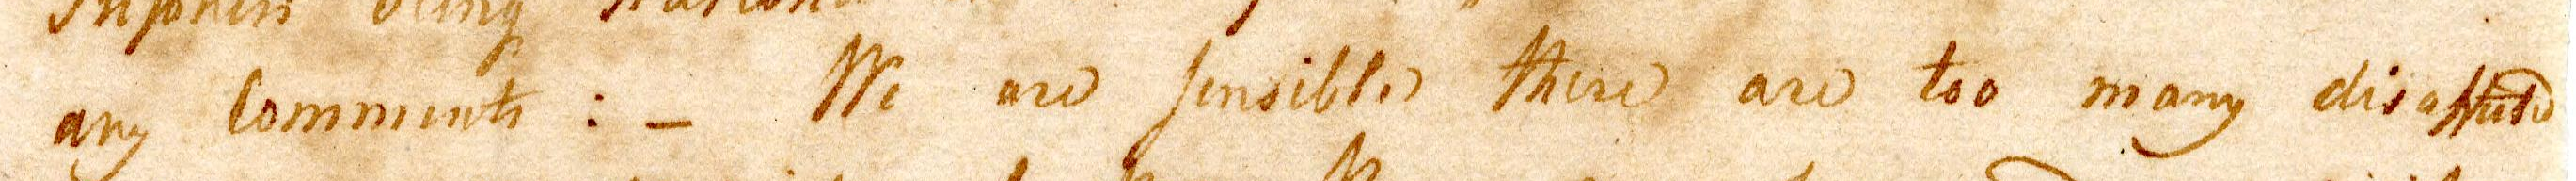any Comments. We are sensible there are too many disaffected
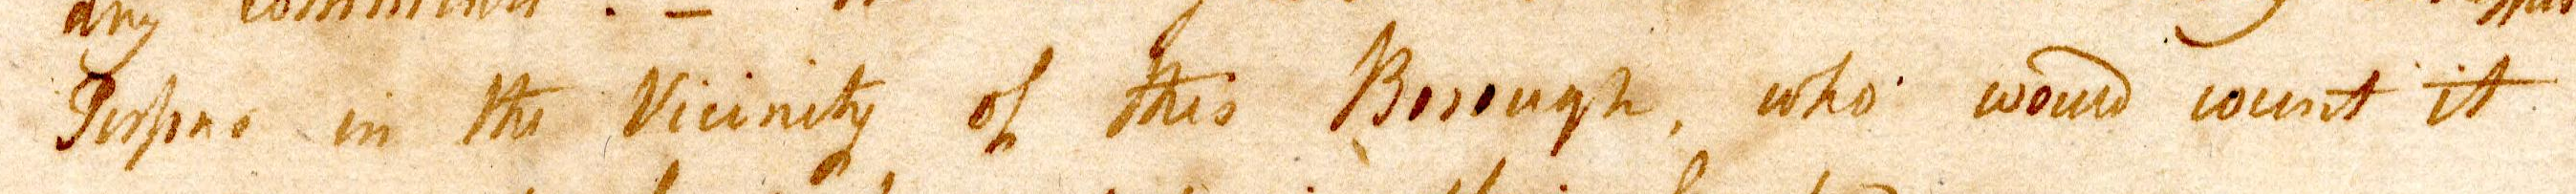Persons in the Vicinity of this Borough, who would count it
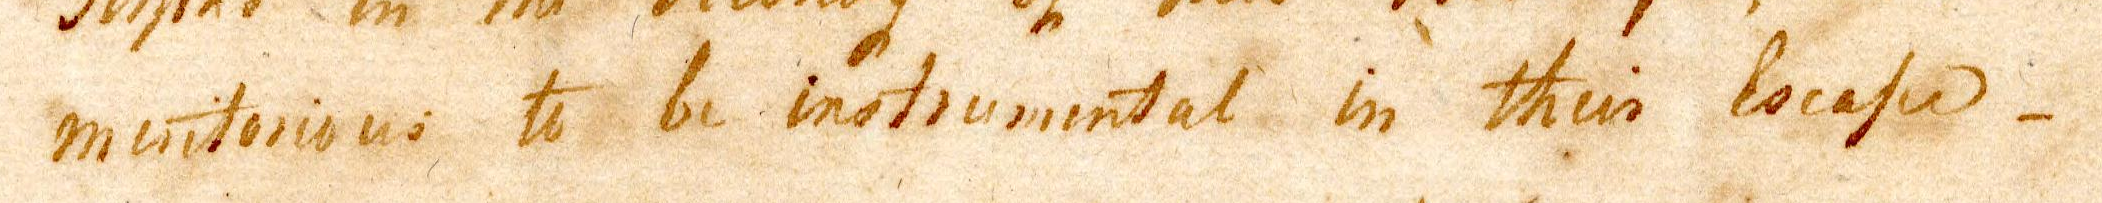meritorious to be instrumental in their Escape.
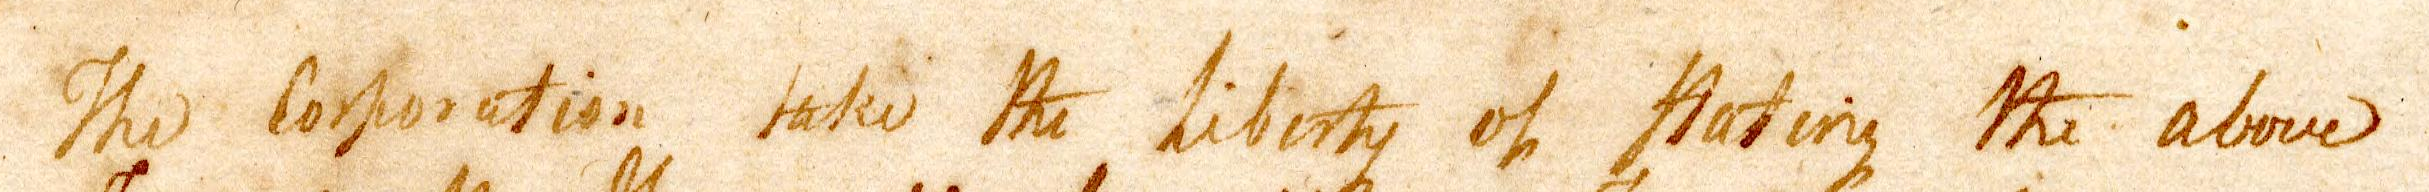The Corporation take the Liberty of stating the above
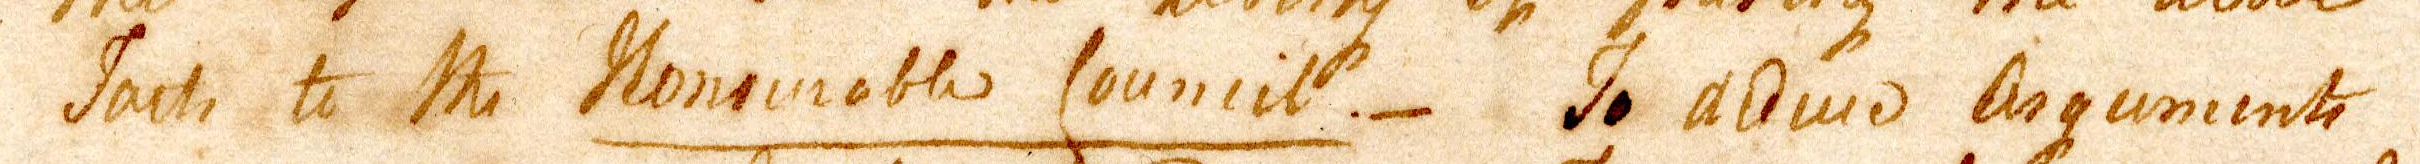Facts to the Honourable Council. To deduce Arguments
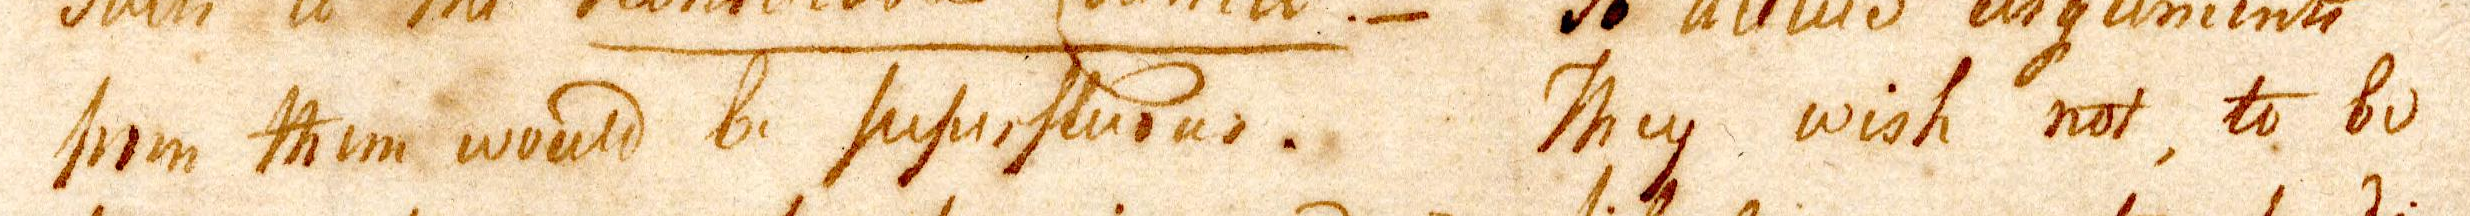from them would be superfluous. They wish not, to be
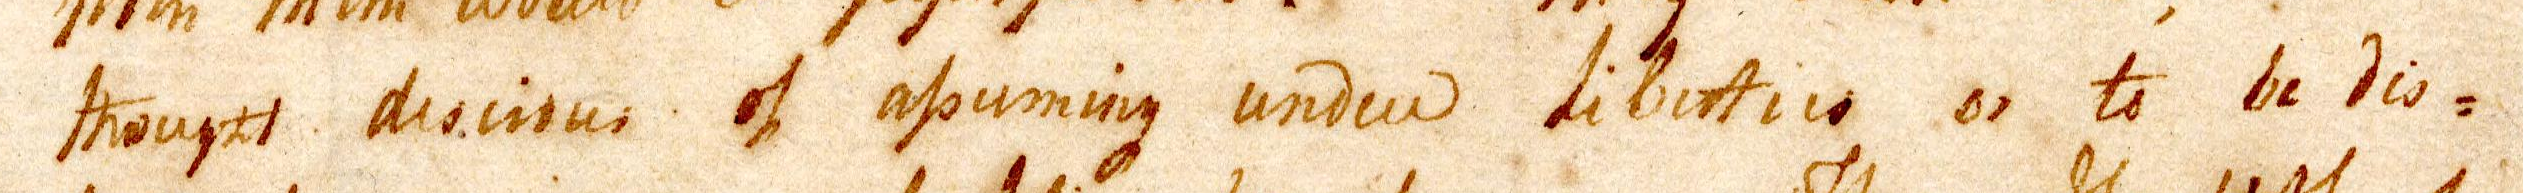thought desirous of assuming under Liberties or to be dis-
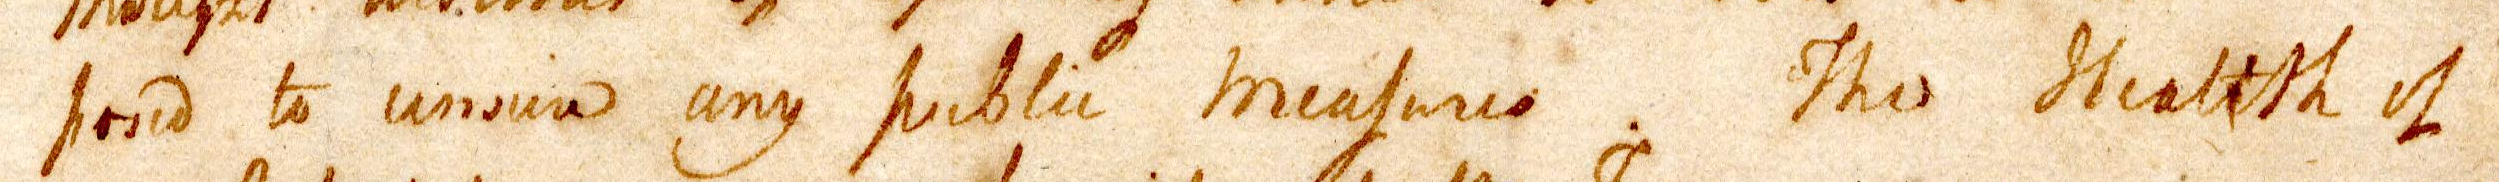-posed to unsure any public measures. The Health of
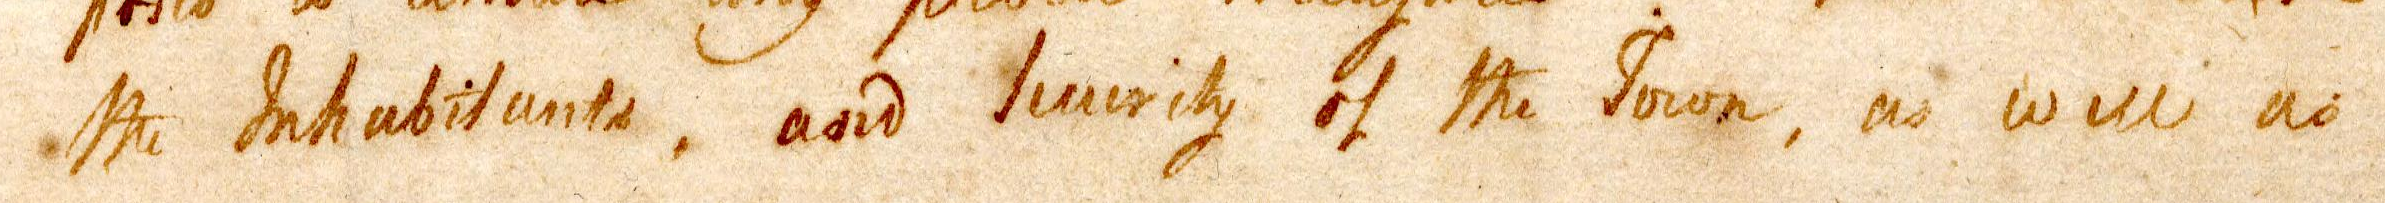the Inhabitants, and Security of the Town, as well as
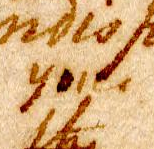your
